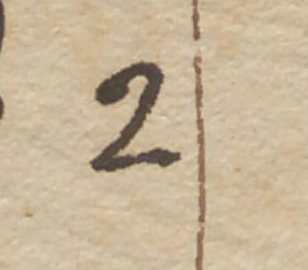2
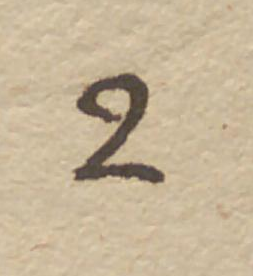2
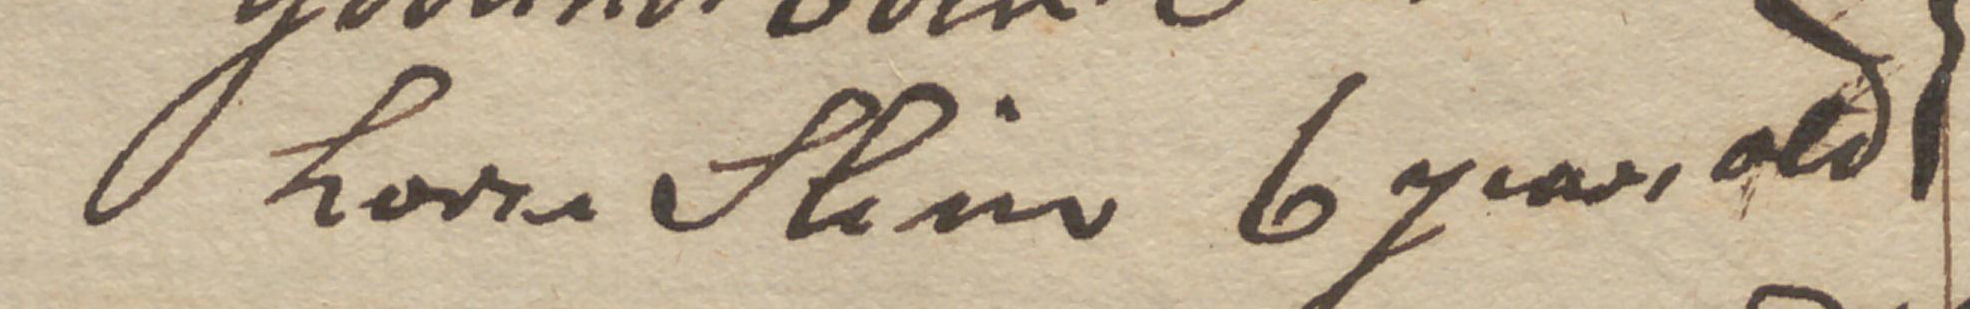horse Slein, 6 years old
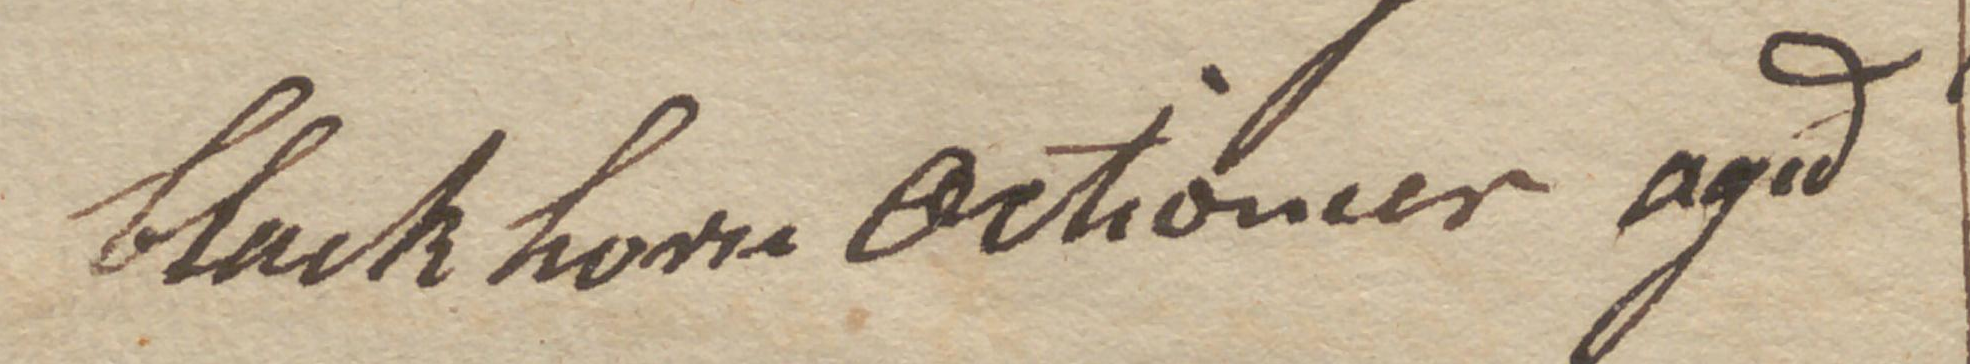black horse Octioneer aged
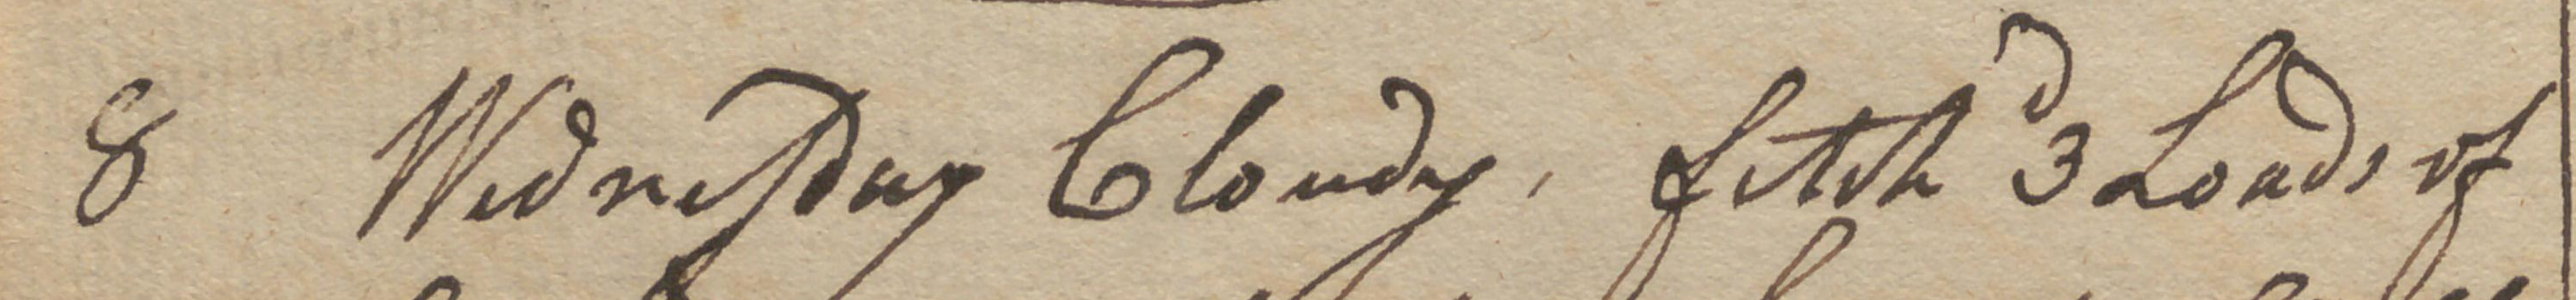8 Wednesday Cloudy, fetch^d 3 Loads of
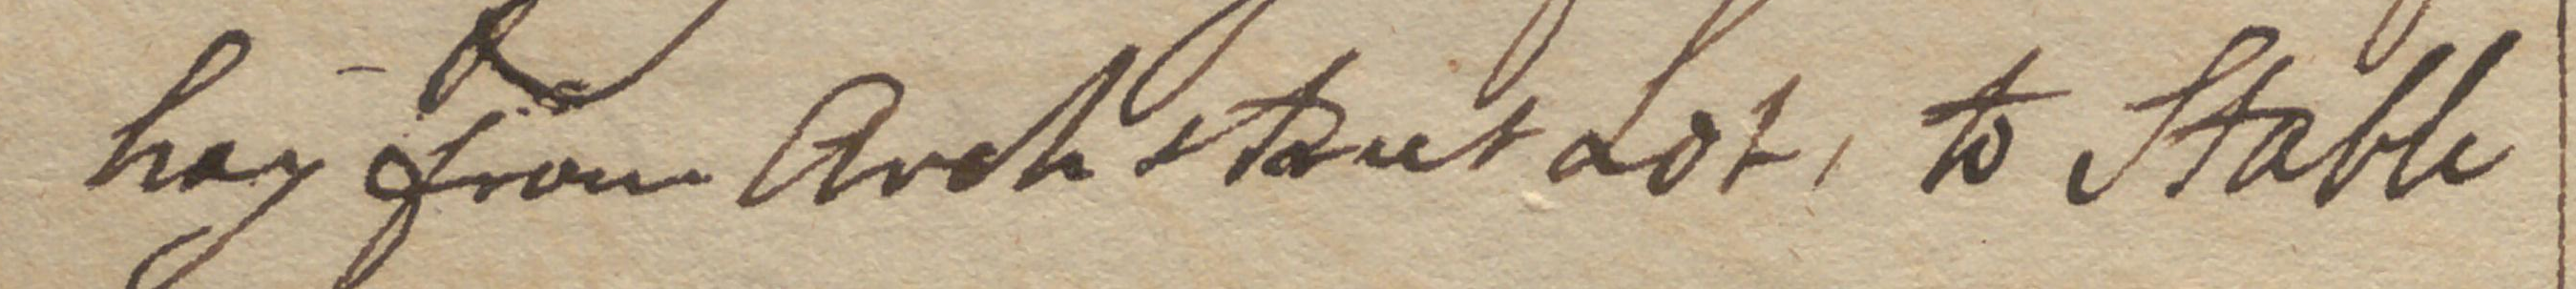hay from Arch street Lot, to Stable
